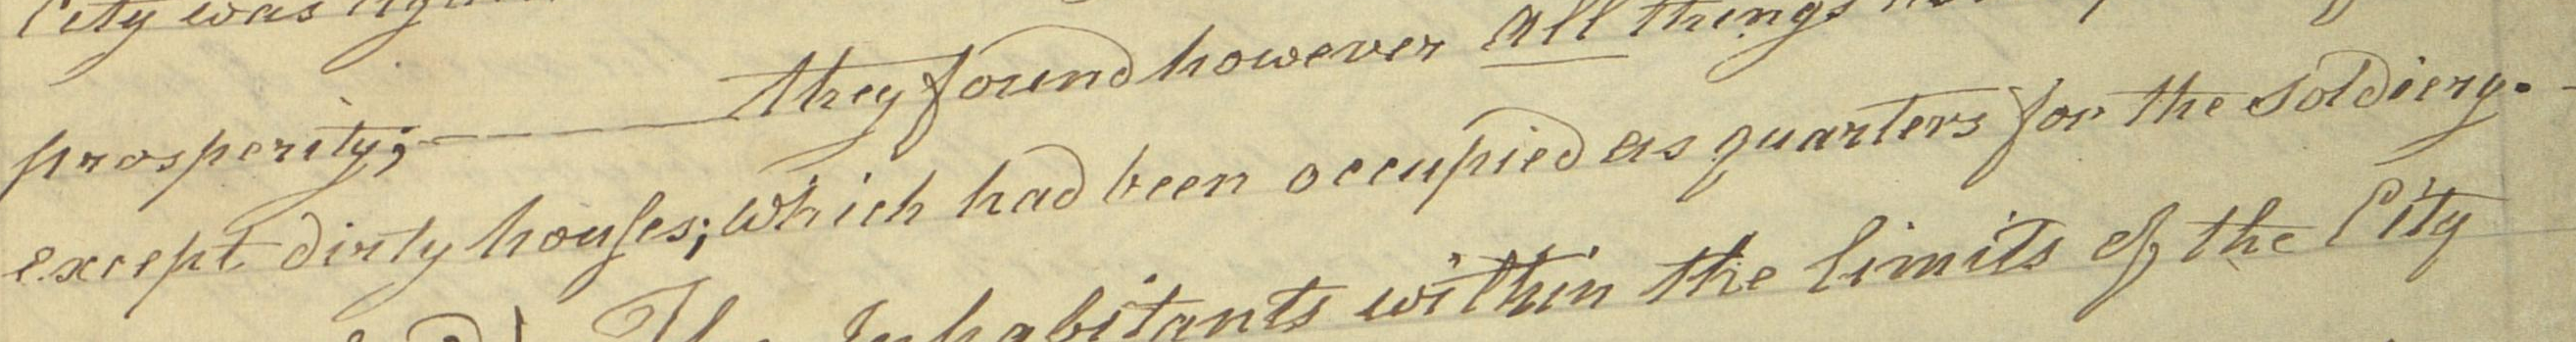except dirty houses; which had been occupied as quarters for the Soldiery.
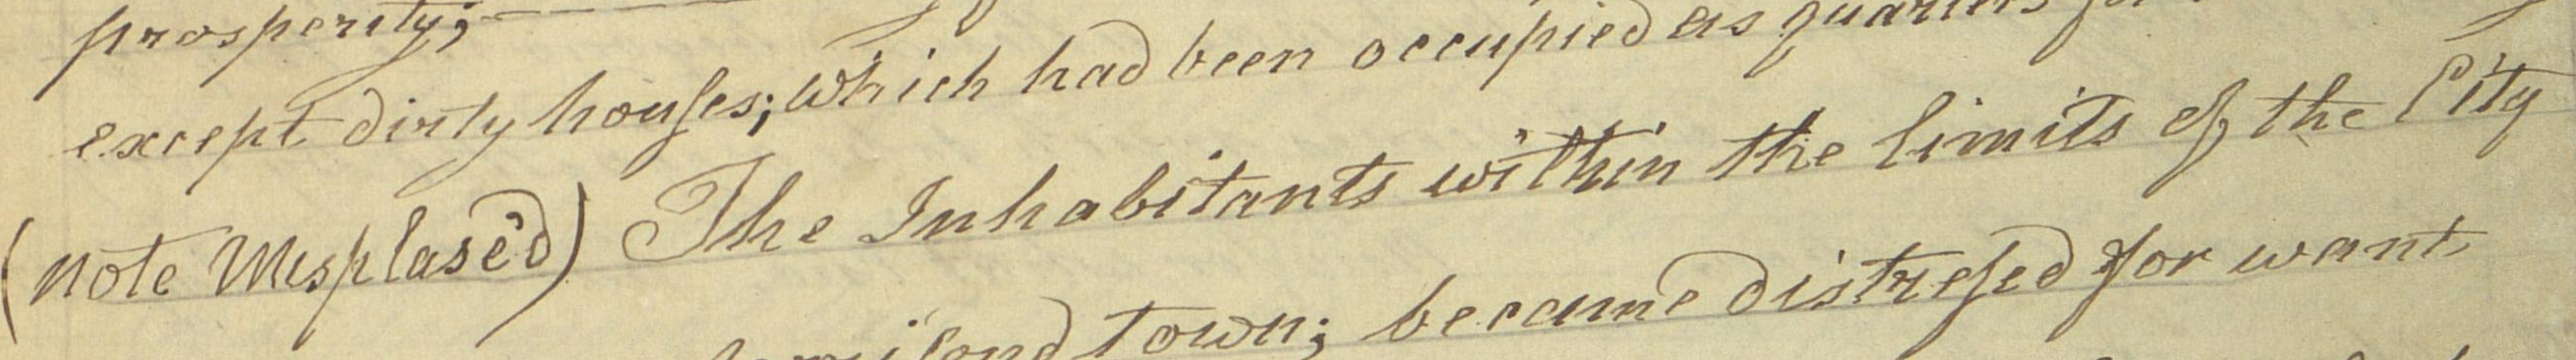(note misplase'd) The Inhabitants within the limits of the City
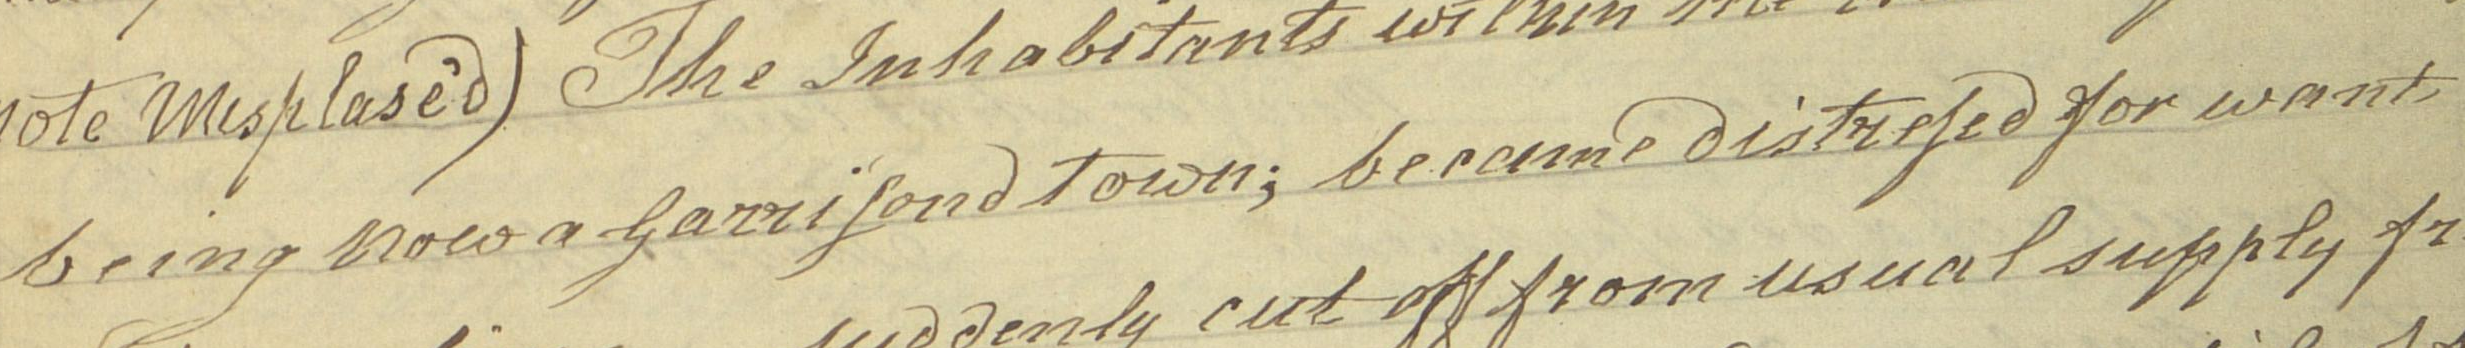being now a Garrisond town; became distressed for want
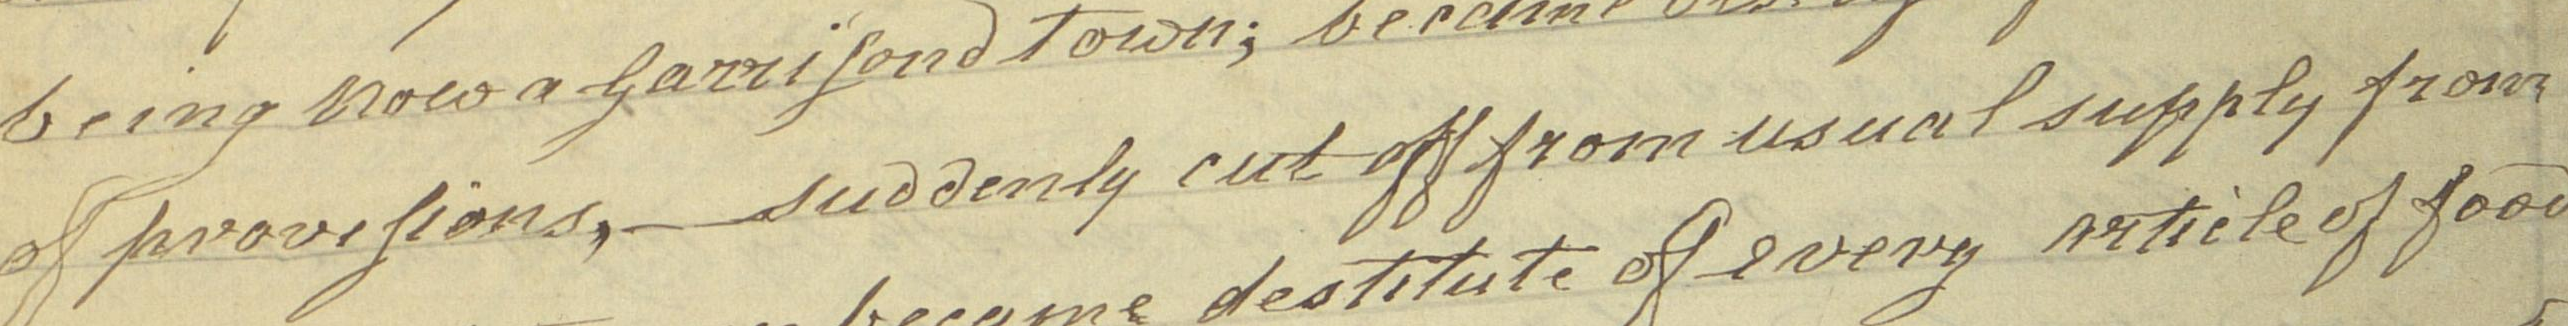of provisions, suddenly cut off from usual supply from
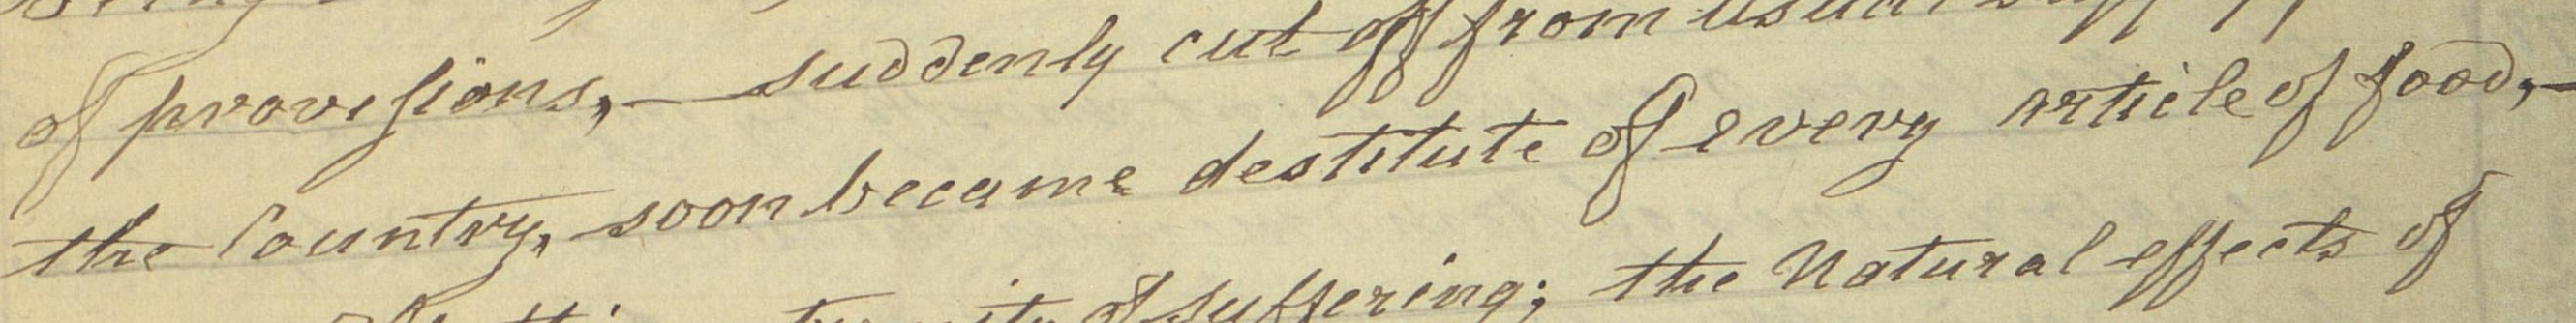the Country, soon became destitute of every article of food,
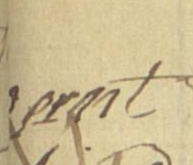-ent
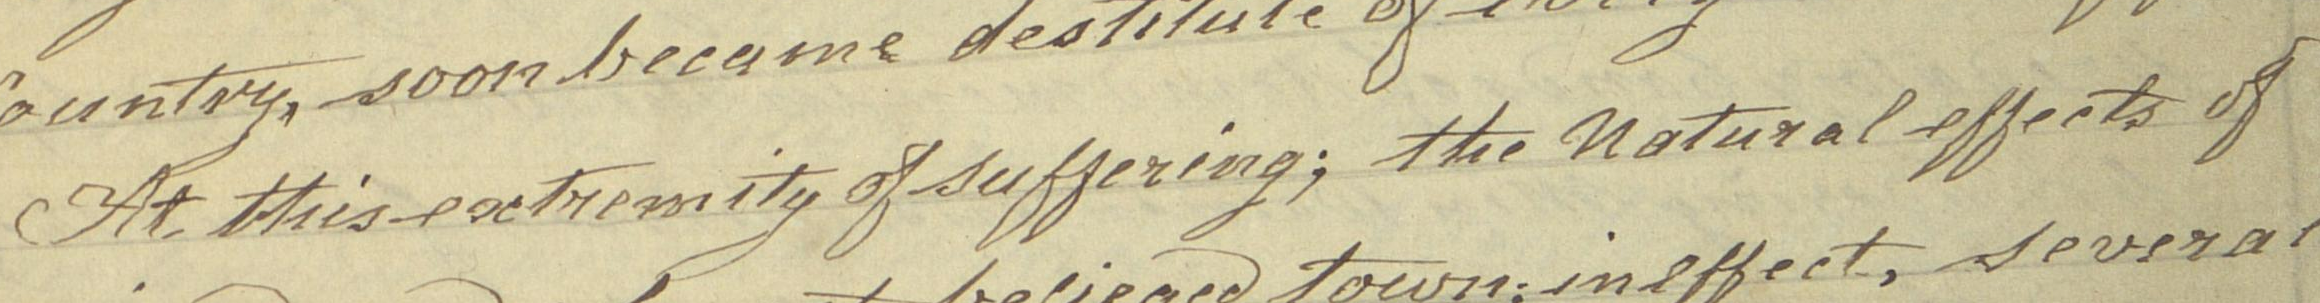At this extremity of suffering; the Natural effects of
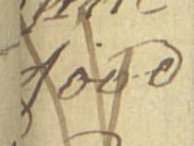-oud
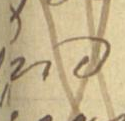-nd
